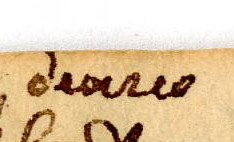deares
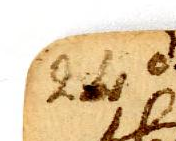24
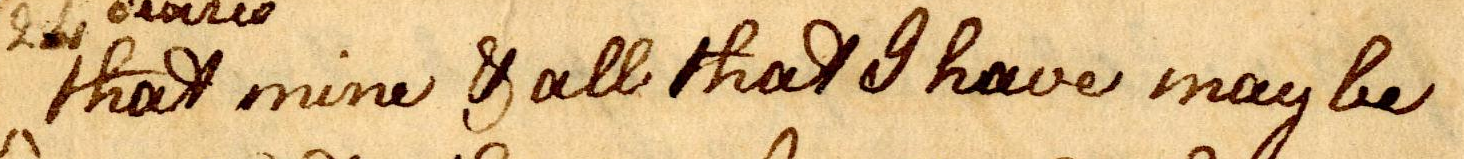^ that mine & all that I have may be
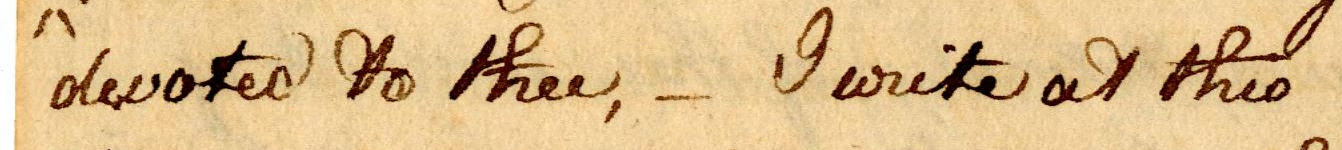devoted to thee,- I write at this
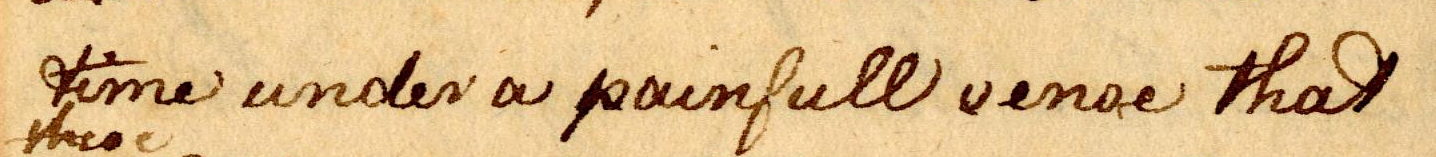time under a painfull sense that
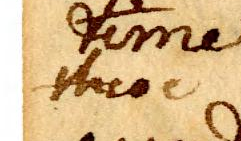these
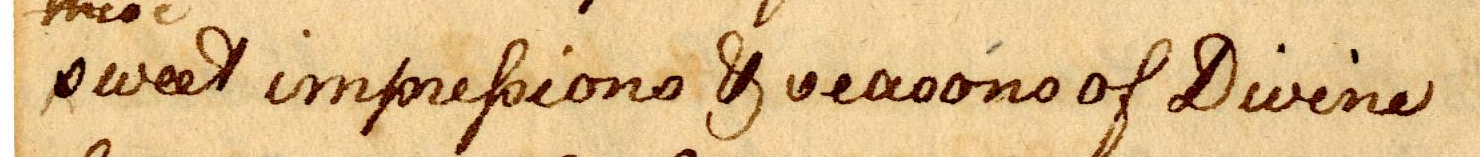^ sweet impressions & seasons of Divine
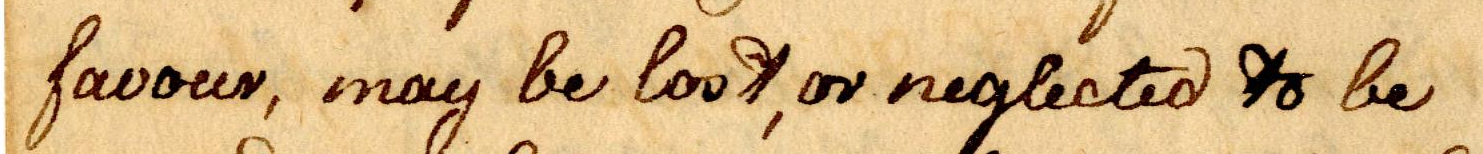favour, may be lost or neglected to be
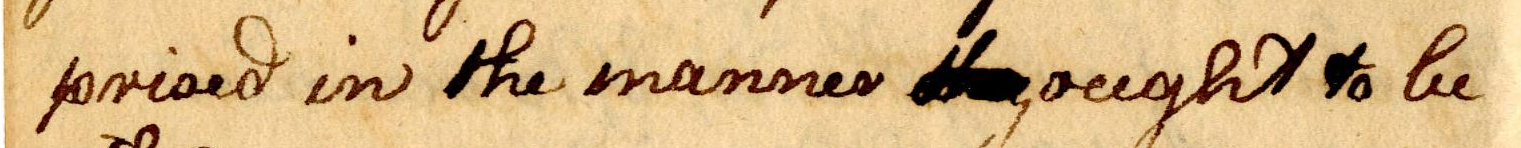prised in the manner [thy] ought to be
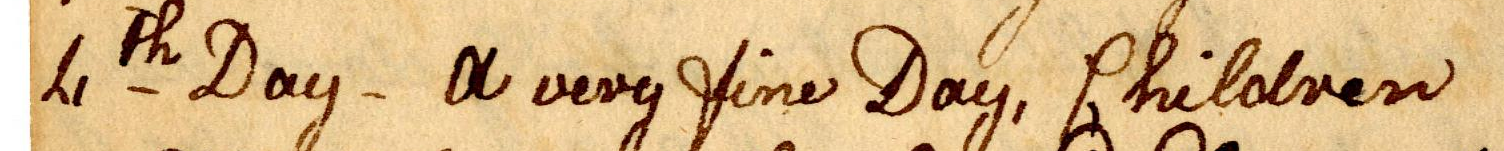4^th Day- A very fine Day, Children
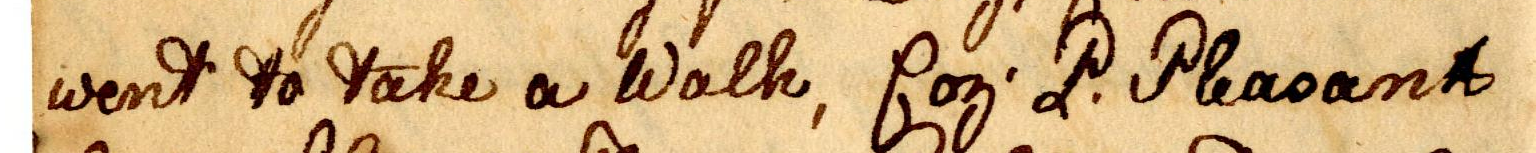went to take a Walk, Coz P. Pleasants
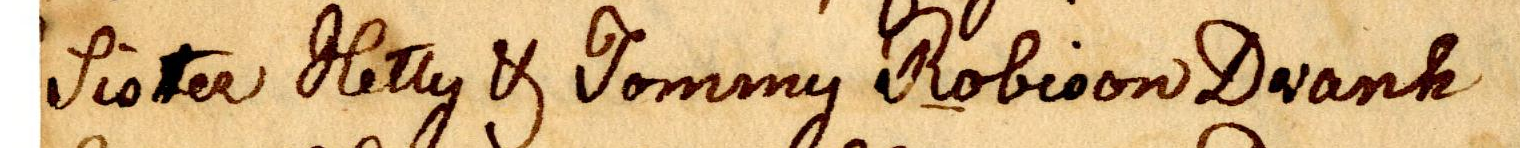Sister Hetty & Tommy Robison Drank
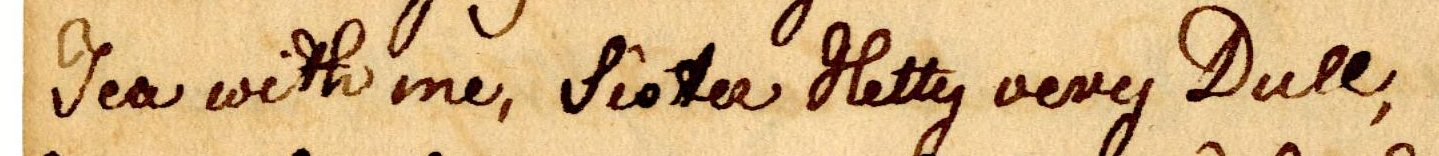Tea with me, Sister Hetty very Dull,
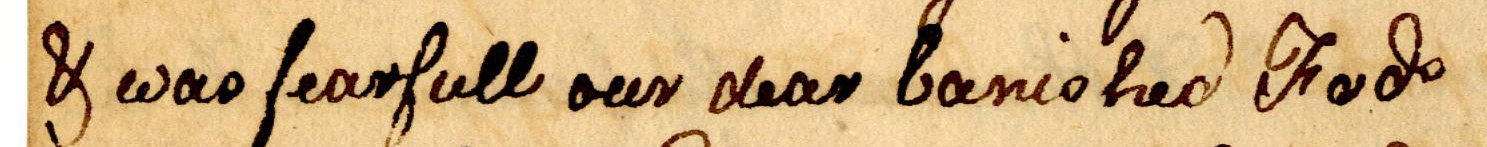& was fearfull our dear banished Frd^s
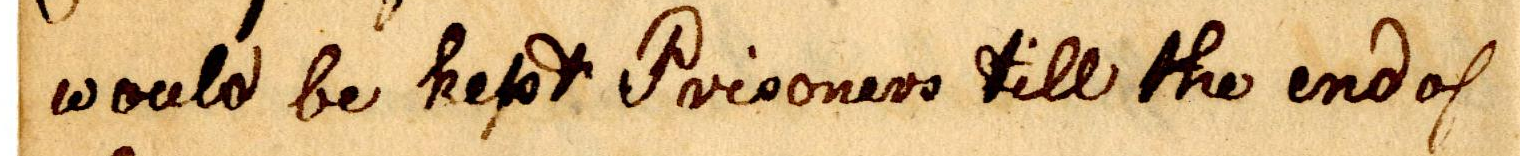would be kept Prisoners till the end of
